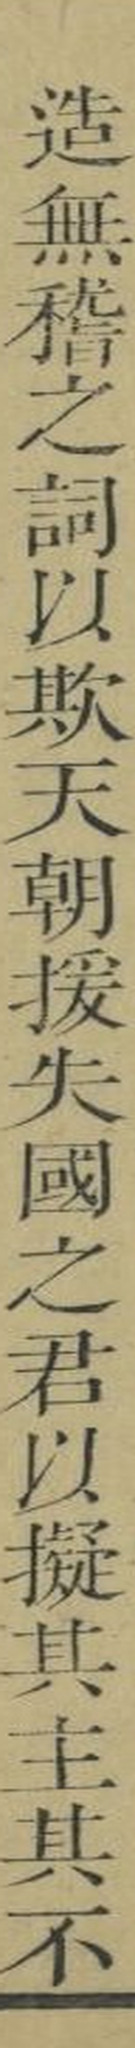造無稽之詞以欺天朝援失国之君以擬其主其不
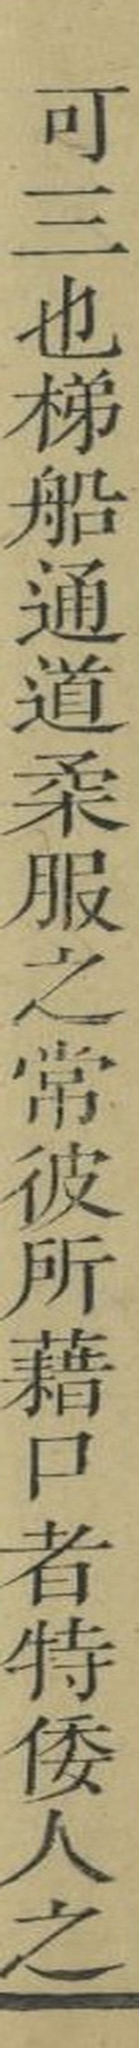可三也梯船通道柔服之常彼所藉口者特倭人之
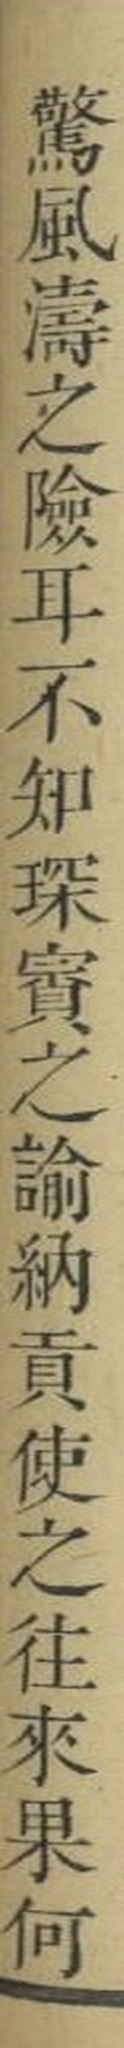驚風濤之険耳不知琛賨之諭納貢使之往来果何
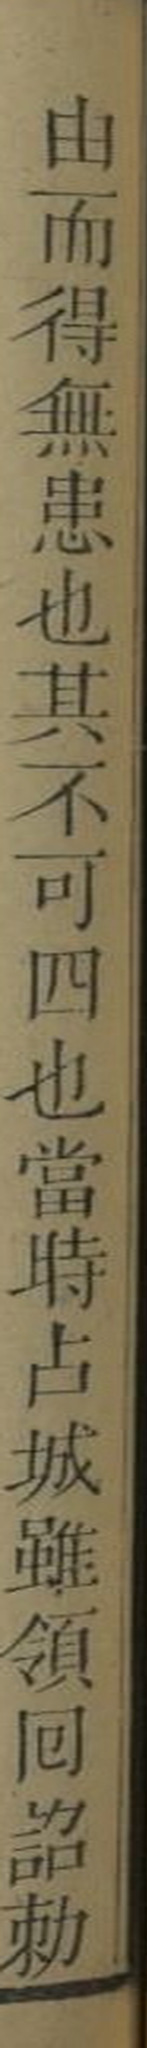由而得無患也其不可四也当時占城雖領回詔勅
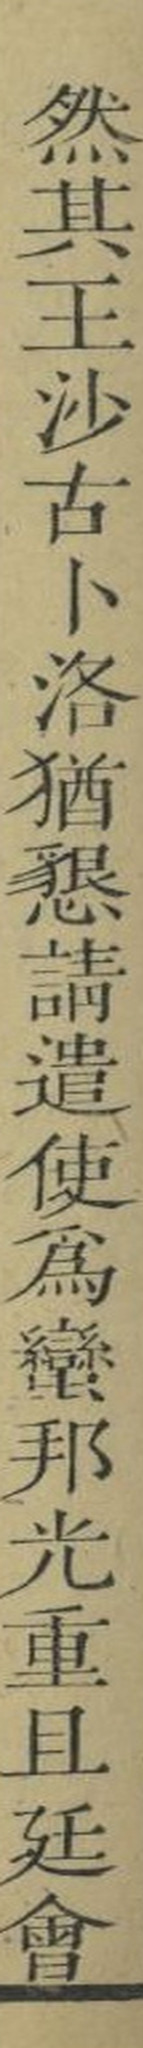然其王沙古卜洛猶懇請遣使為蛮邦光重且廷会
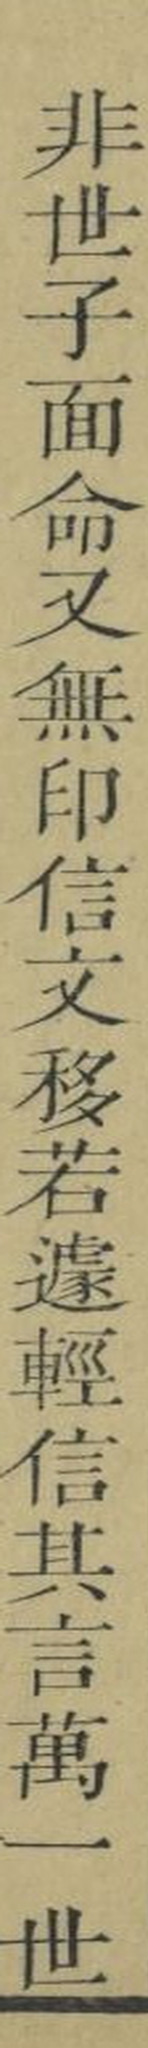非世子面命又無印信文移若遽軽信其言万一世
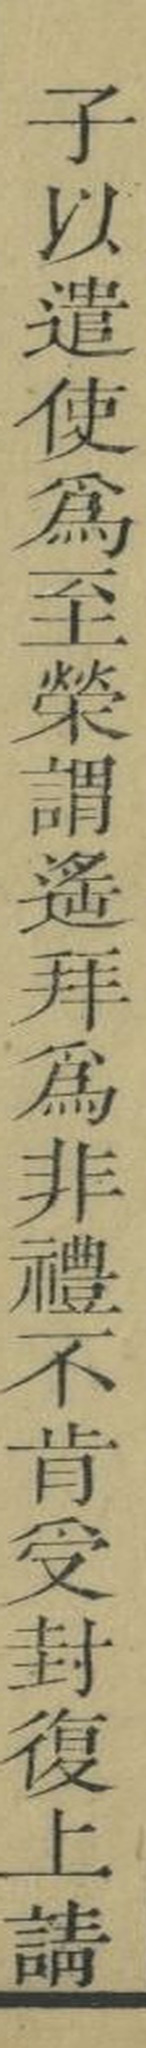子以遣使為至栄謂遥拝為非礼不肯受封復上請
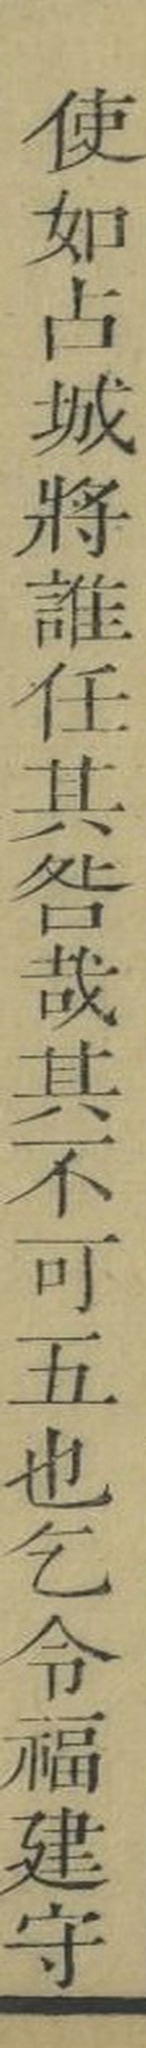使如占城将誰任其咎哉其不可五也乞令福建守
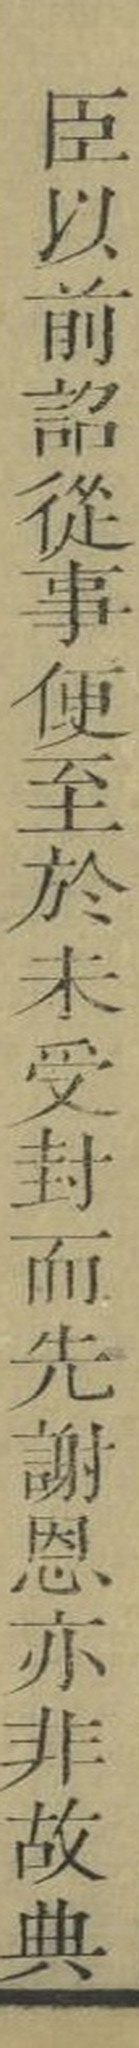臣以前詔従事便至於未受封而先謝恩亦非故典
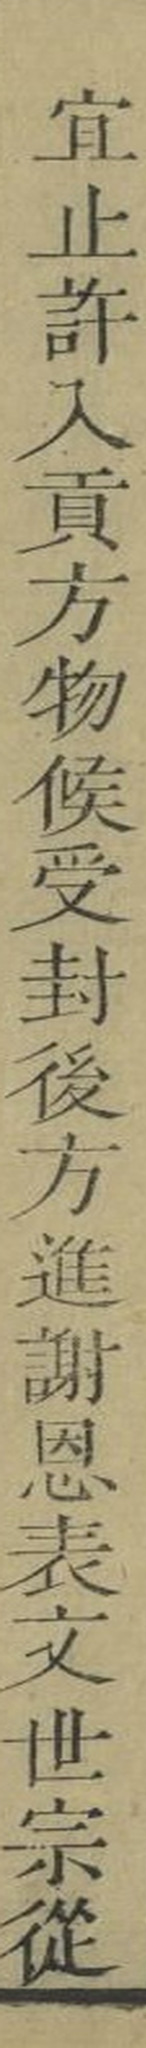宜止許入貢方物候受封後方進謝恩表文世宗従
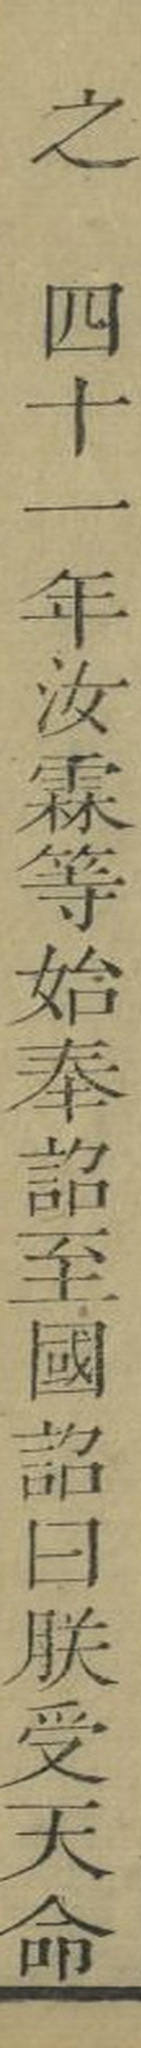之四十一年汝霖等始奉詔至国詔曰朕受天命
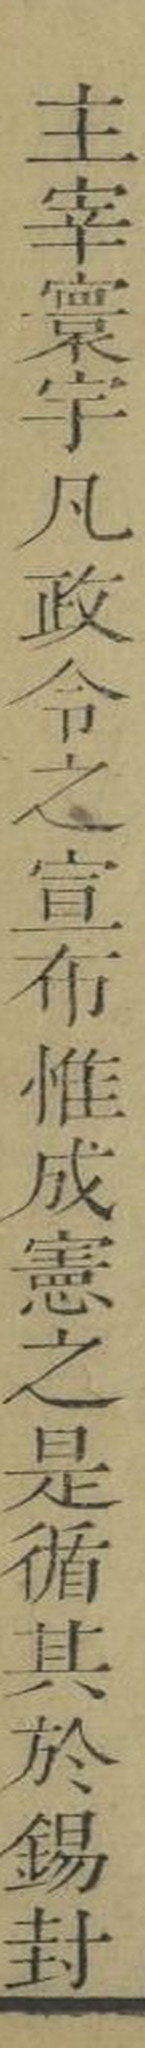主宰寰宇凡政令之宣布惟成憲之是循其於錫封

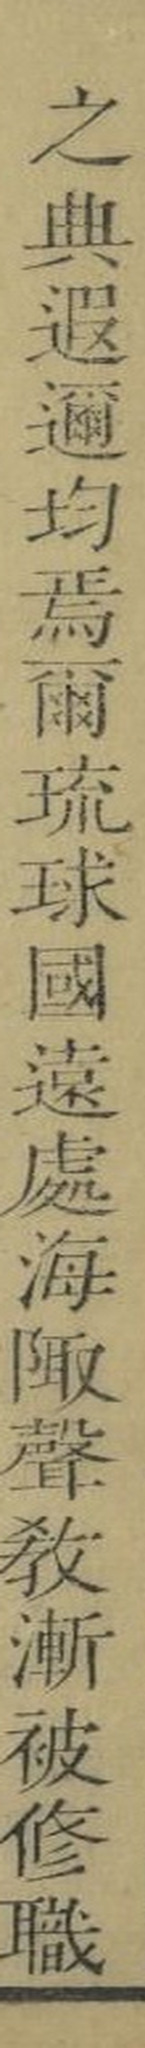之典遐邇均焉爾琉球国遠処海陬声教漸被修職
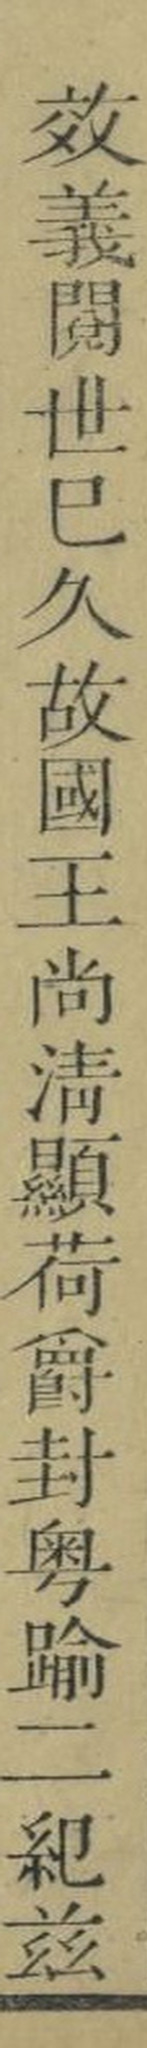效義閲世巳久故国王尚清顕荷爵封粤踰二紀茲
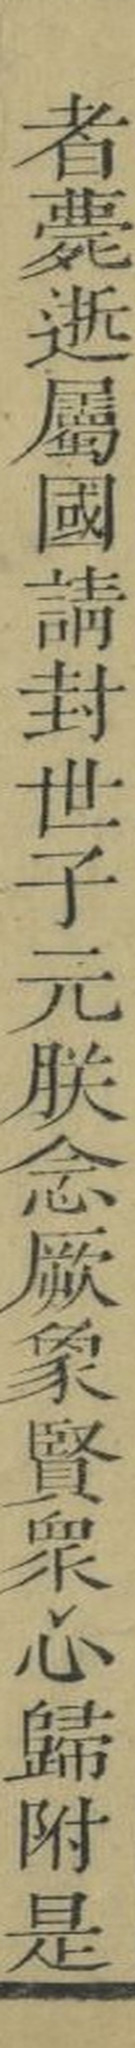者薨逝属国請封世子元朕念厥象賢衆心帰附是
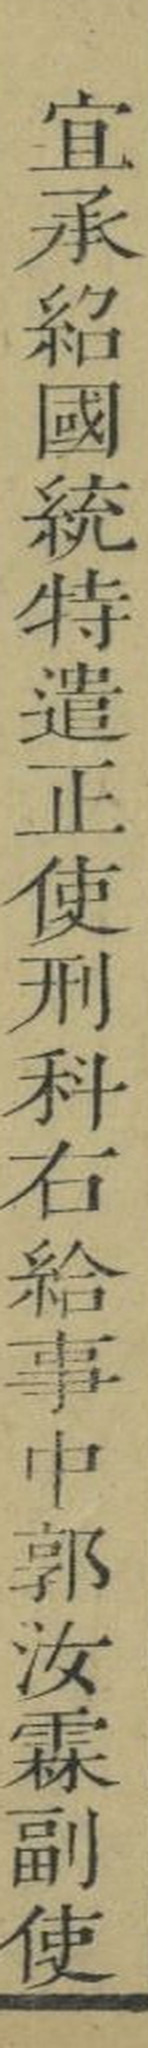宜承紹国統特遣正使刑科右給事中郭汝霖副使
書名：中山伝信録 巻三
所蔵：University of the Ryukyus Library
